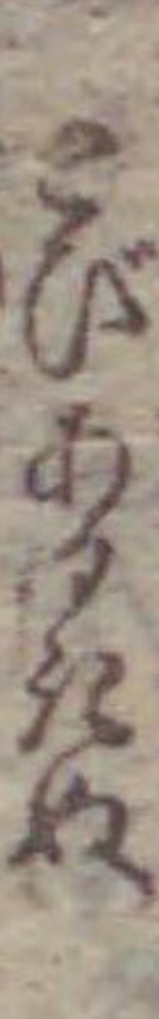とびあるきぬ
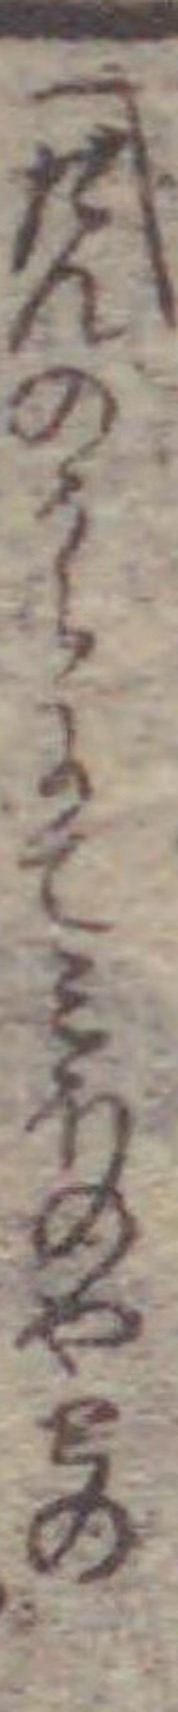〽だんのうらにてみほのやとの
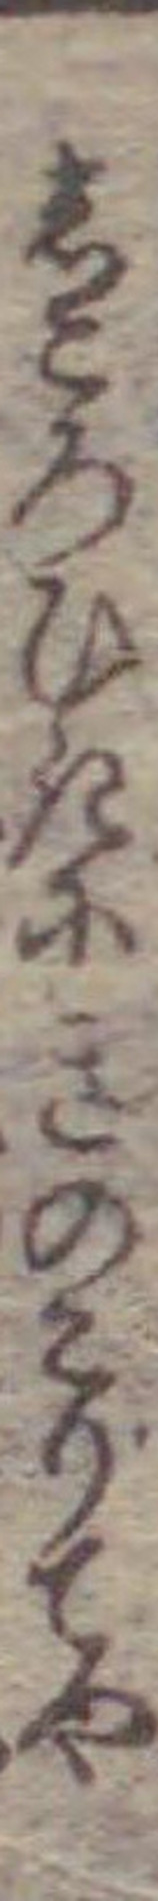しころひきにことのこりてや
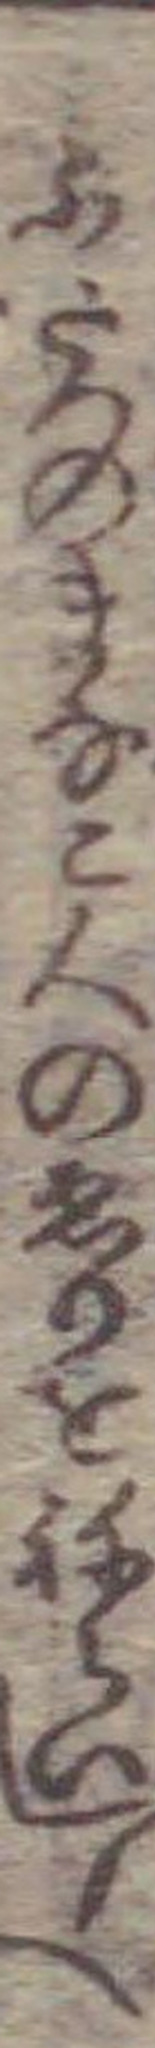ふたつのまなこ人のゑりをねらいし
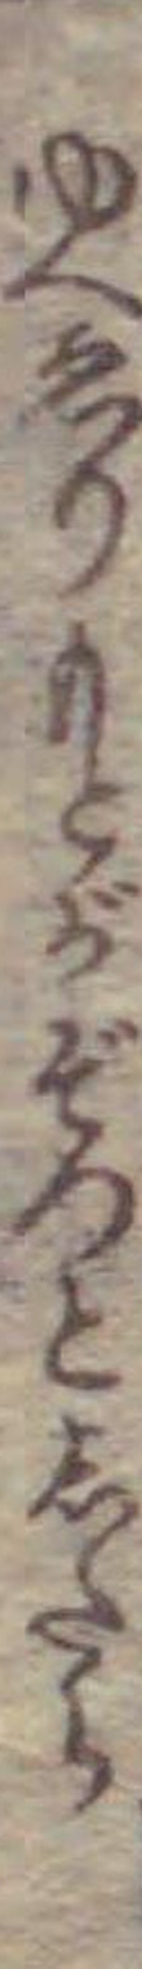ゆへゑりもとがぞつとしたら
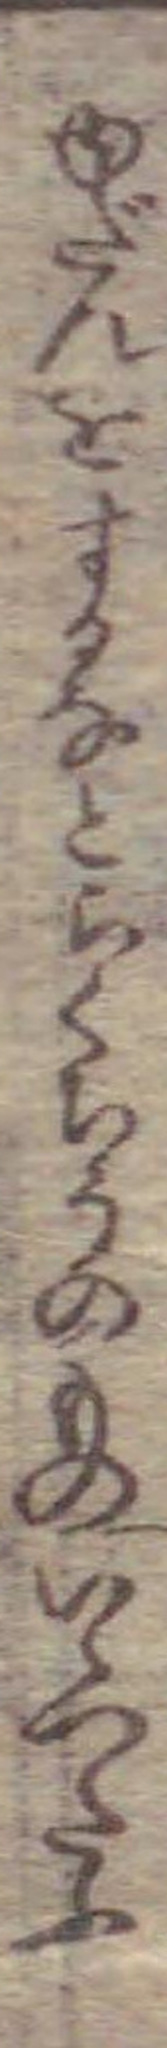ゆだんをするなとらくちうのものいゝつたふ

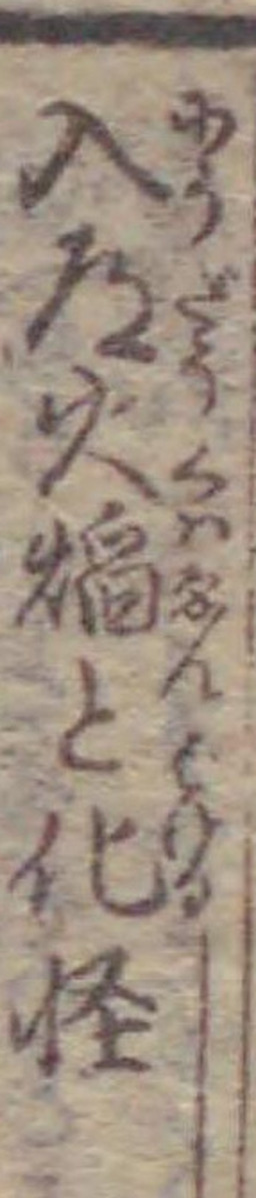入道火焔と化怪
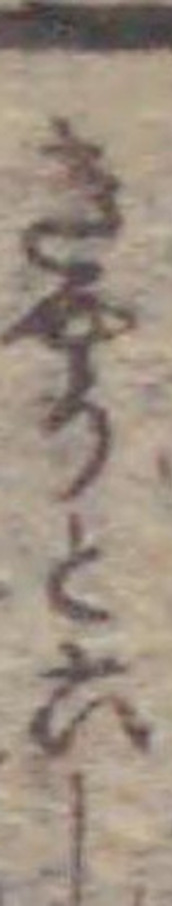きやうと六
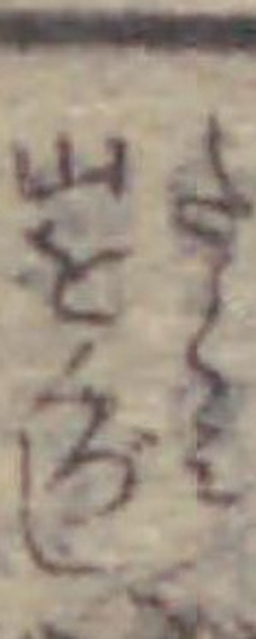山をくづし
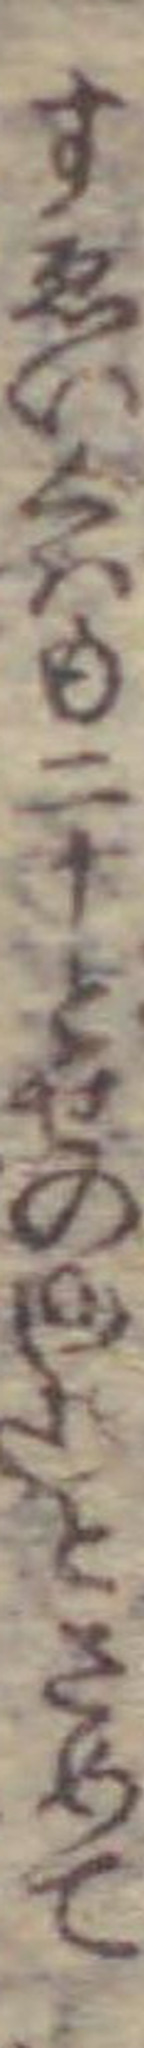すゑいぐはも二十とせのゆめとさめて

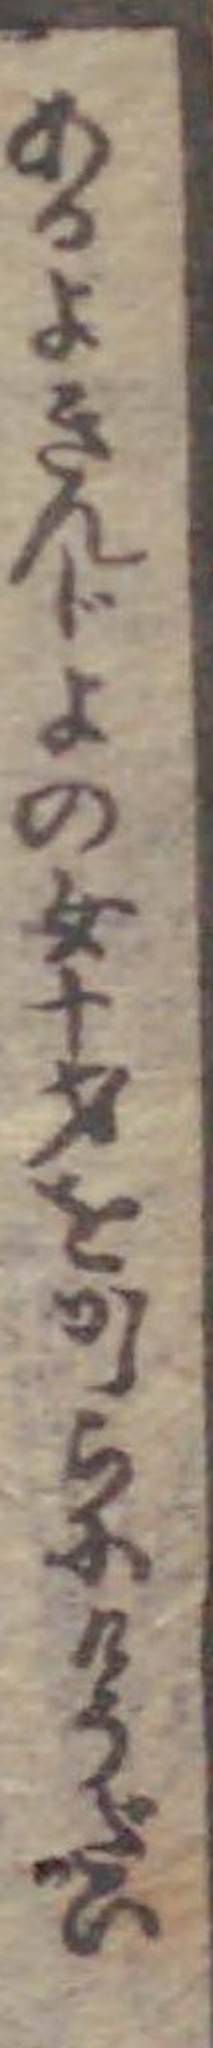あるよきんじよの女十才をかしらにけうだい
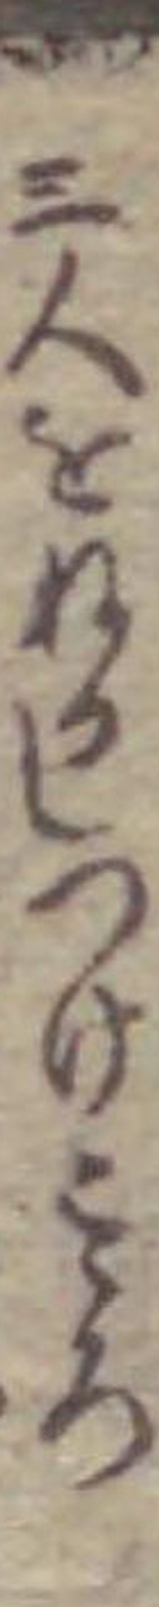三人をねかしつけこゝろ
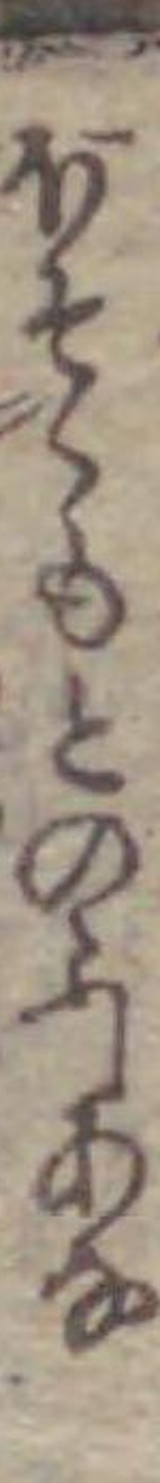ぼそくもとのふしあな
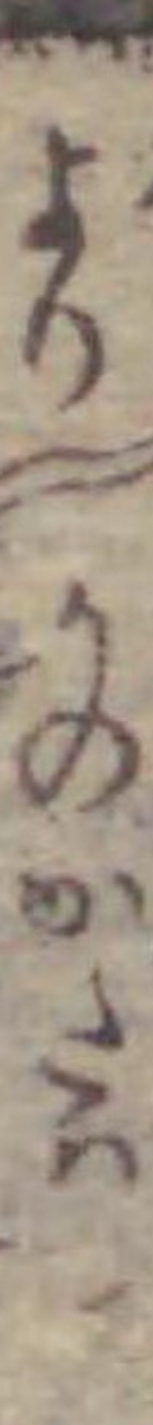よりかのかたは
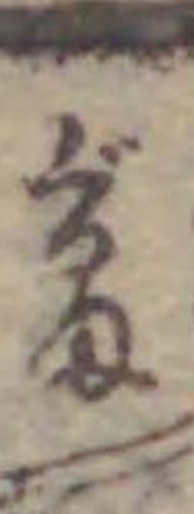ぐるま
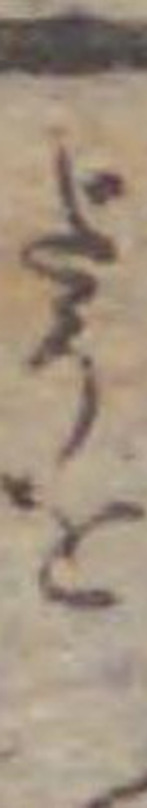だうを
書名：武家物奇談 : 3巻
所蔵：国立国会図書館 National Diet Library, JAPAN
